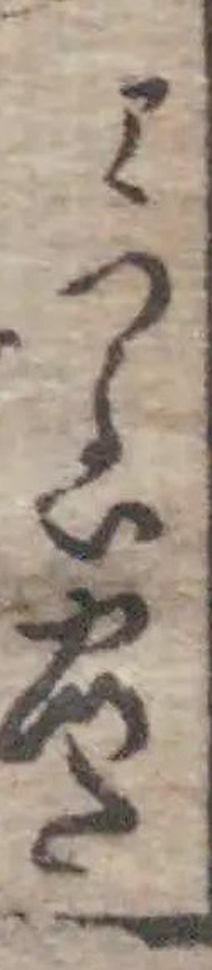アヽつよいやつた
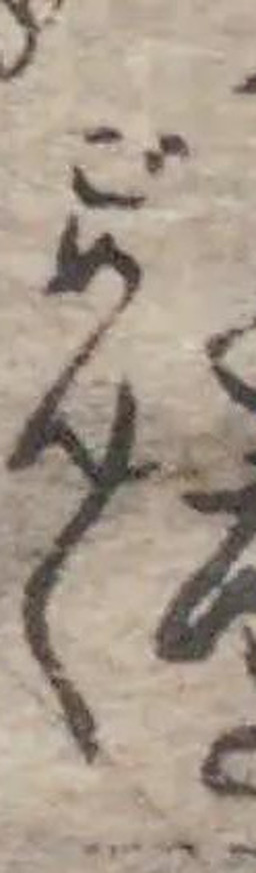ごめん〳〵
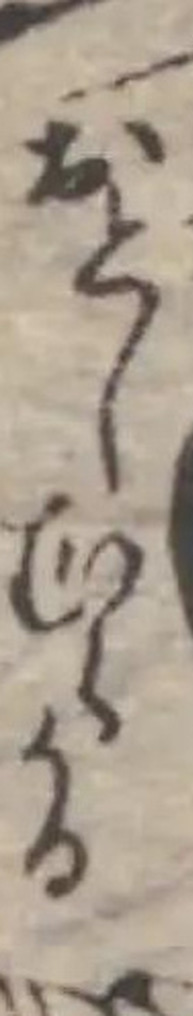おとしむらかる
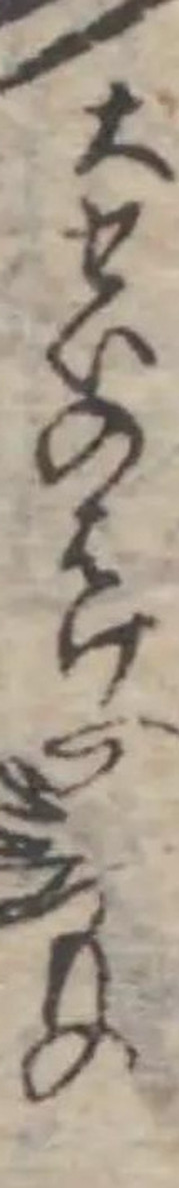大せいのはけもの
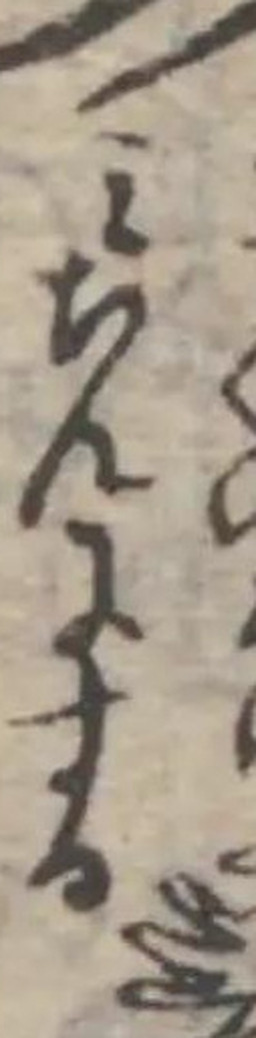みちんにする

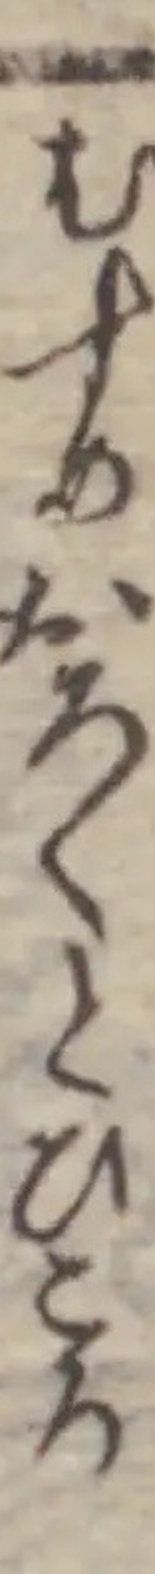むすめおろくとひころ
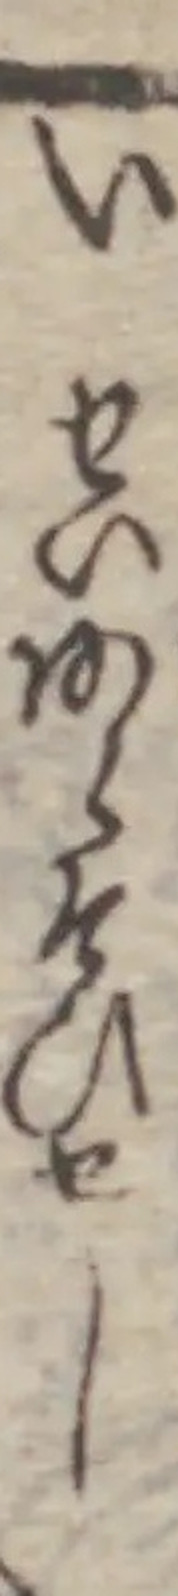いせいあらそひせし
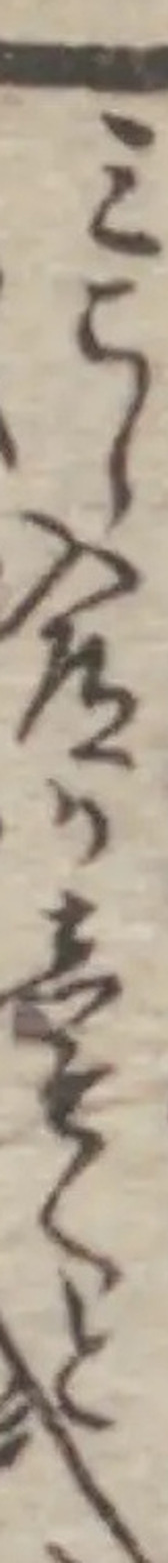みこし入道かしそくと
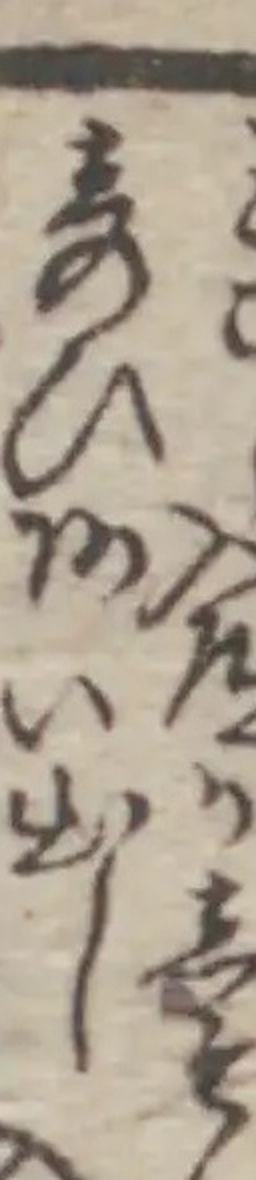しのひあい出し
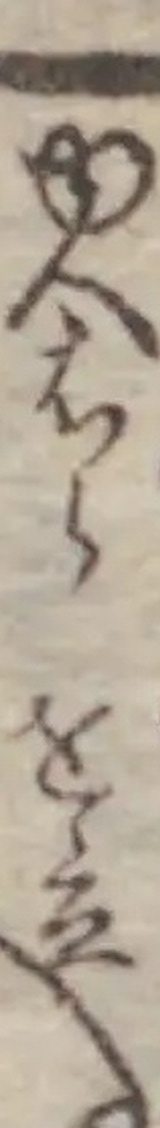ゆへはらを立
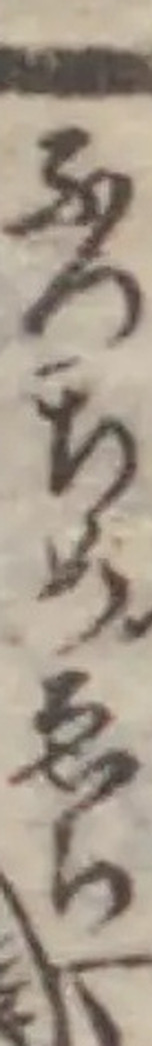ふつちめゑち
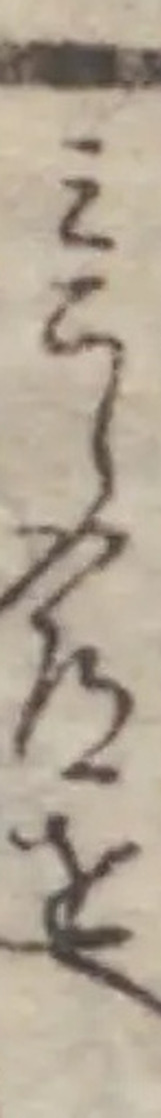みこし入道を
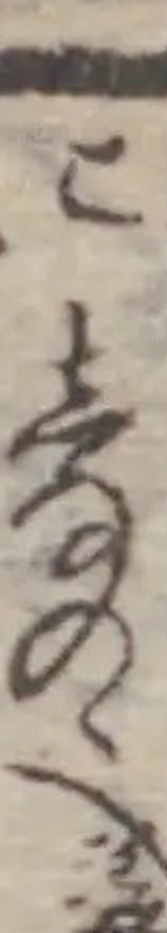こしなのゝ
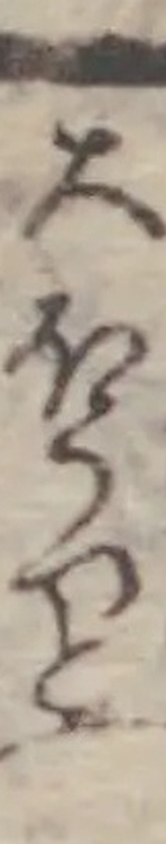大ほうつと
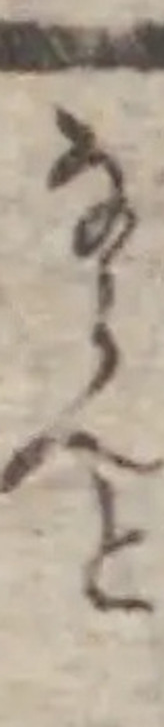ならんと
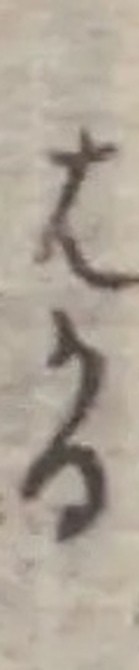大かる
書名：化物三ツ目大ほうい 2巻
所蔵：国立国会図書館 National Diet Library, JAPAN
